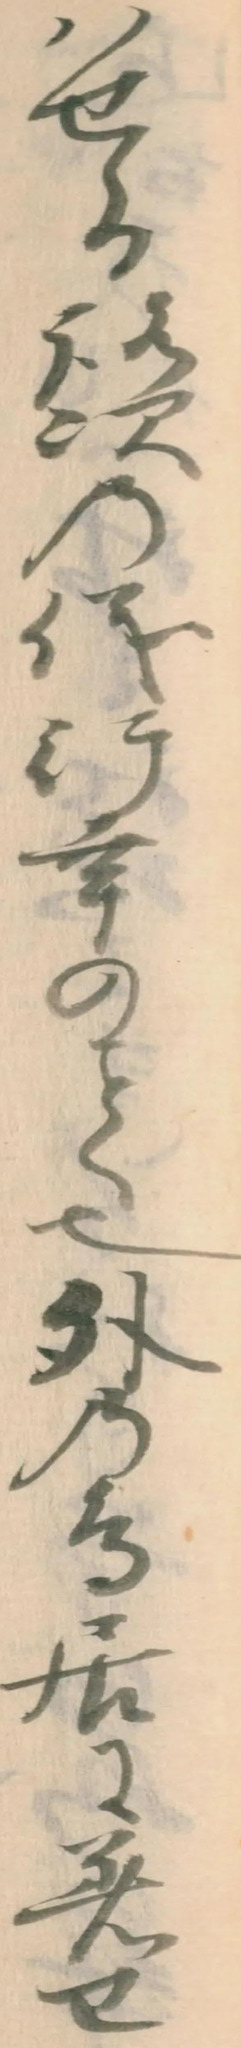はせらる路次の儀行幸のことく也外の鳥居に着せ
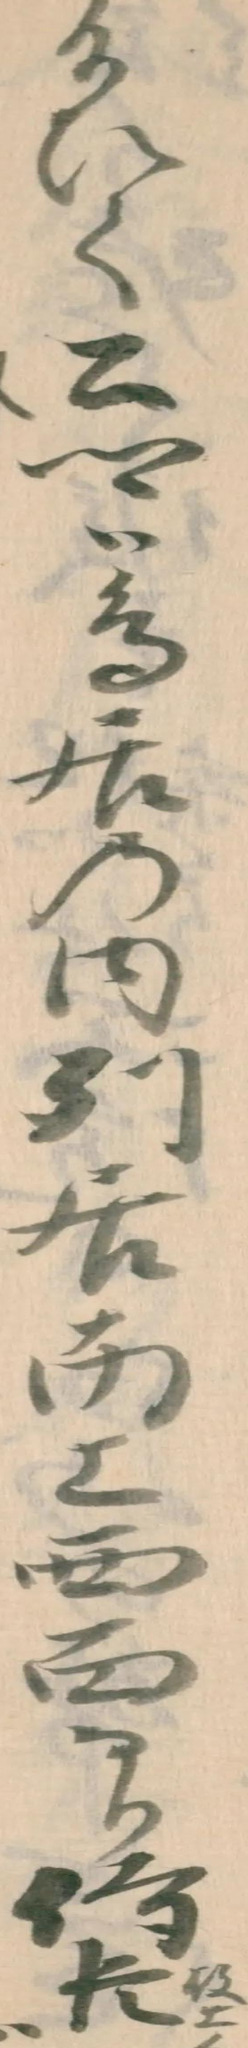給ひて公卿は鳥居の内列居南上西面なり侍臣は
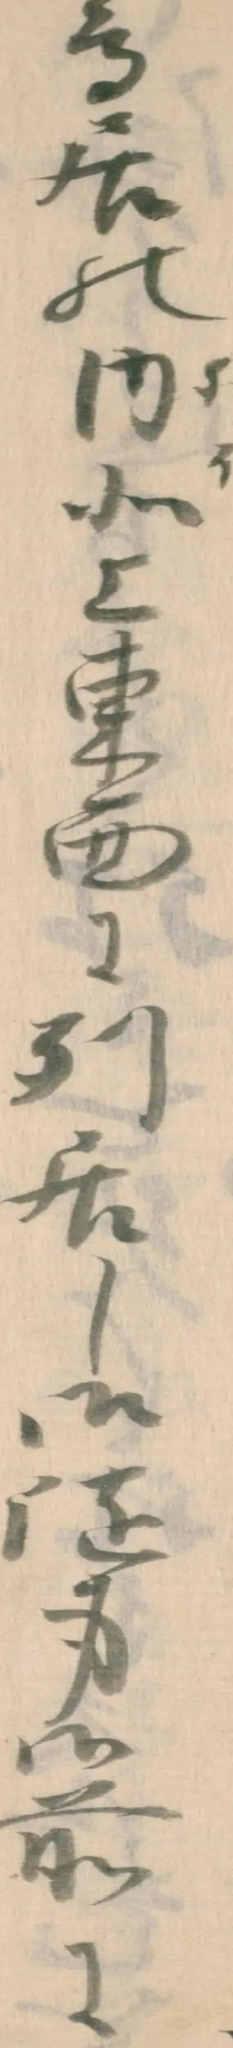鳥居の内北上東面に列居し御随身御前に
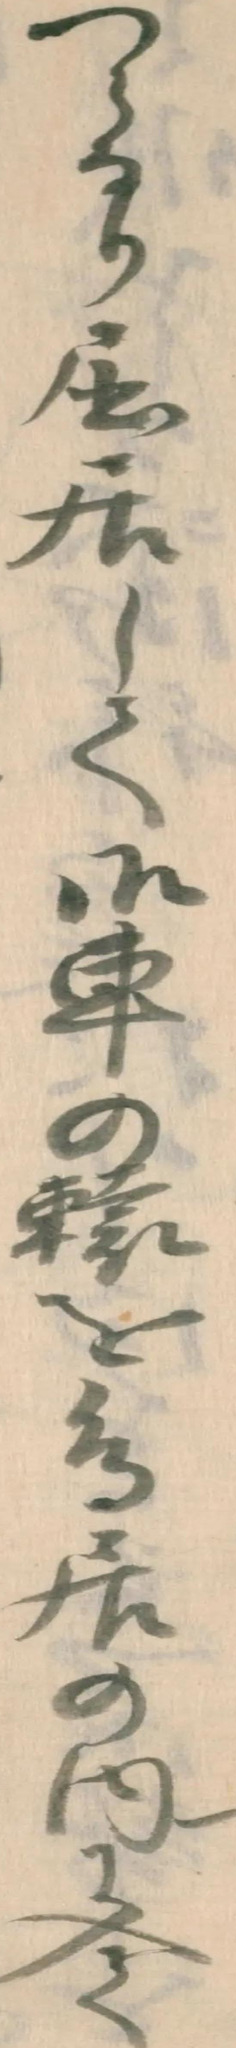つらなり屈居して御車の轅を鳥居の内に入て
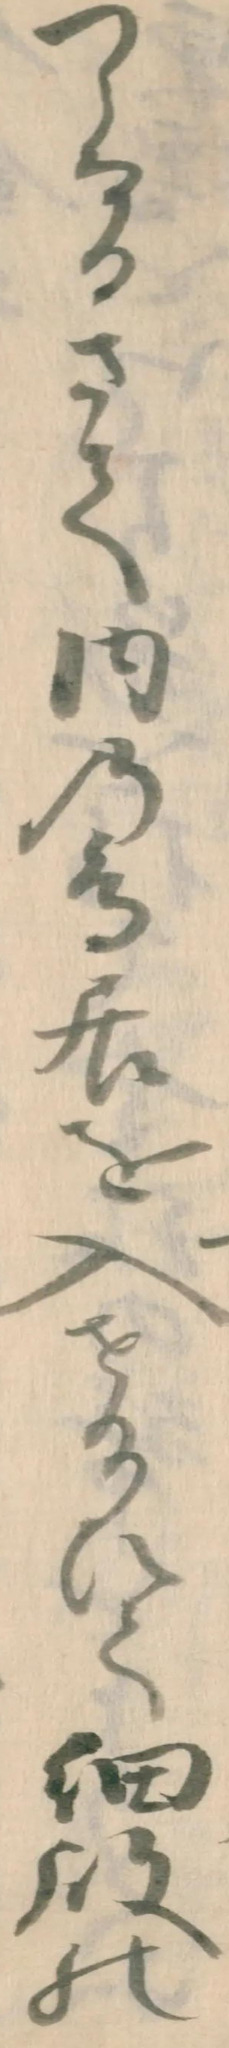つらなるさて内の鳥居を入せ給ひて細殿の
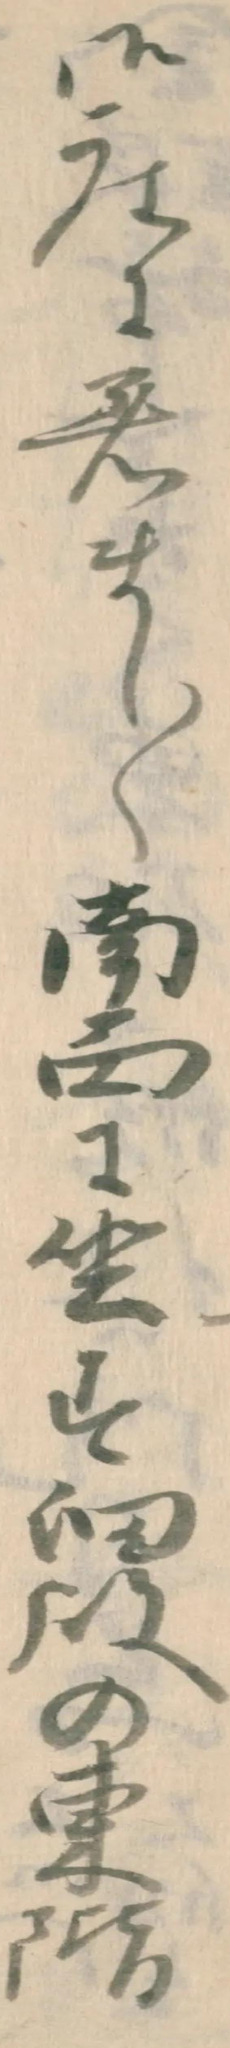御座に着まし〳〵南面に坐す細殿の東階より
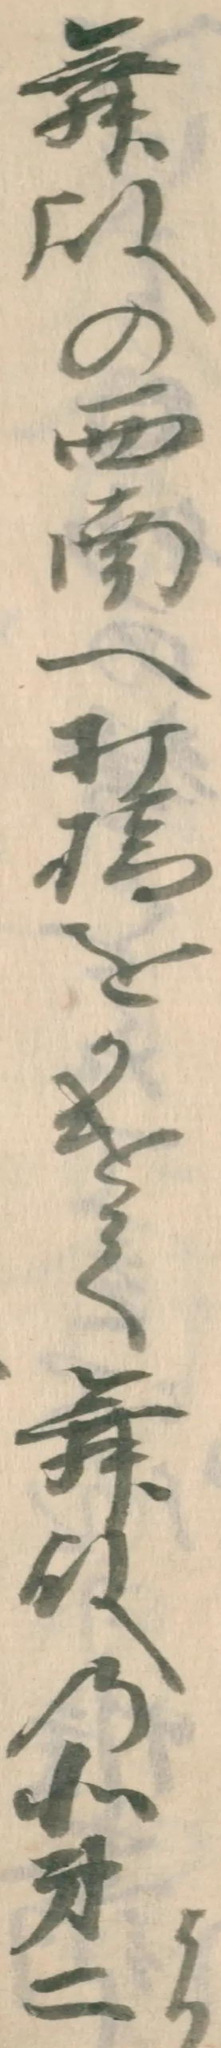舞殿の西南へ打橋をかけて舞殿の北第二
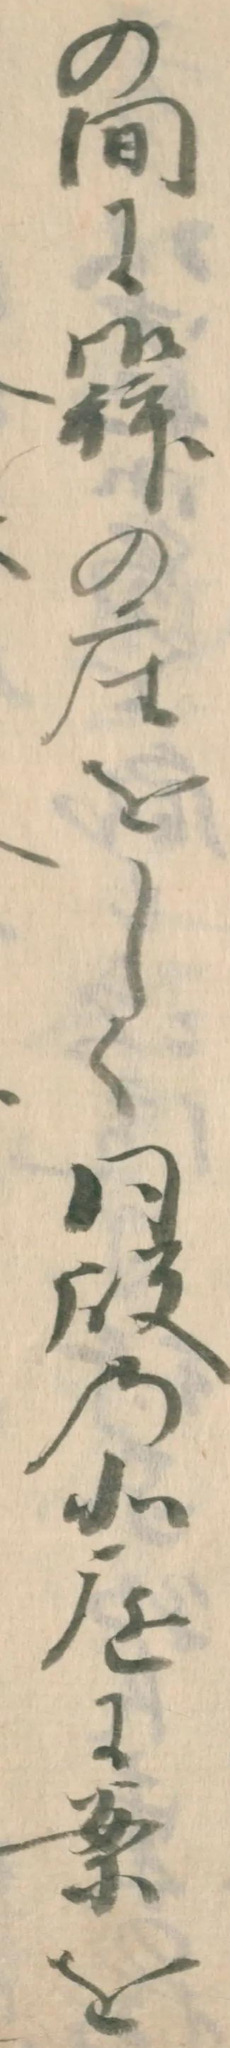の間に御拝の座をしく同殿の北庭に案を
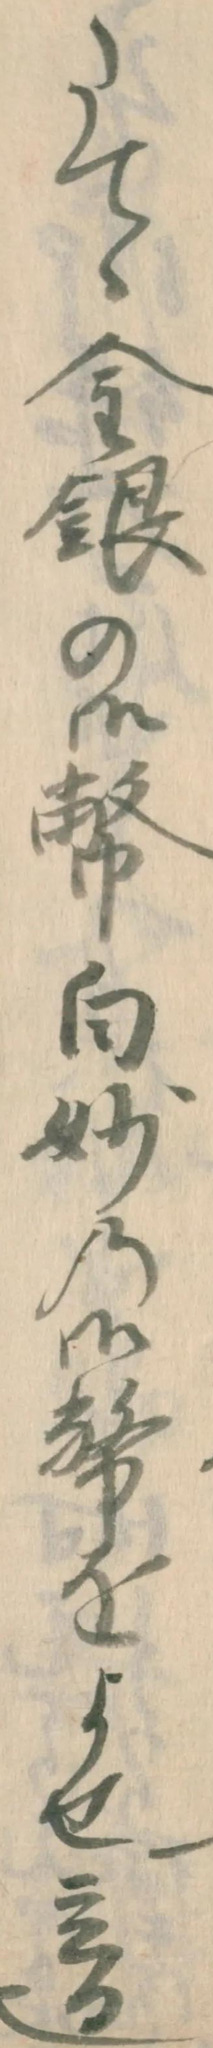たてゝ金銀の御幣白妙の御幣をよせ立る也

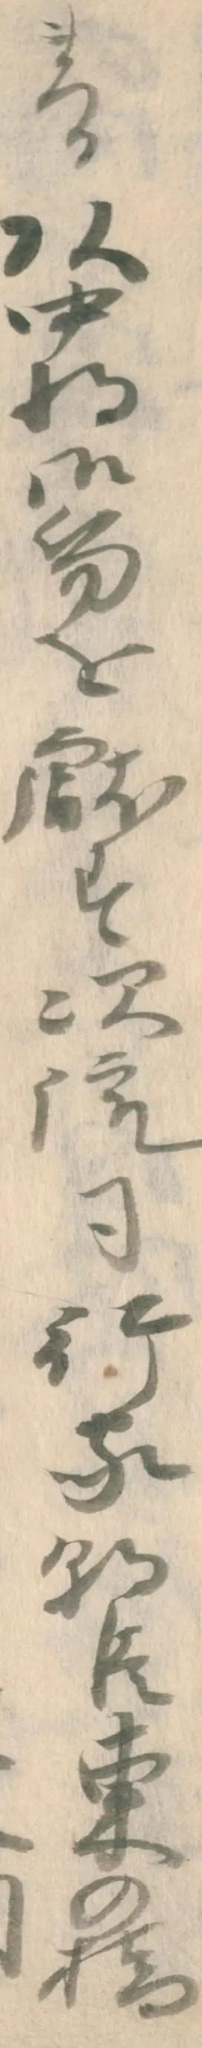まつる頭中将御笏を献す次院司行家朝臣東の橋
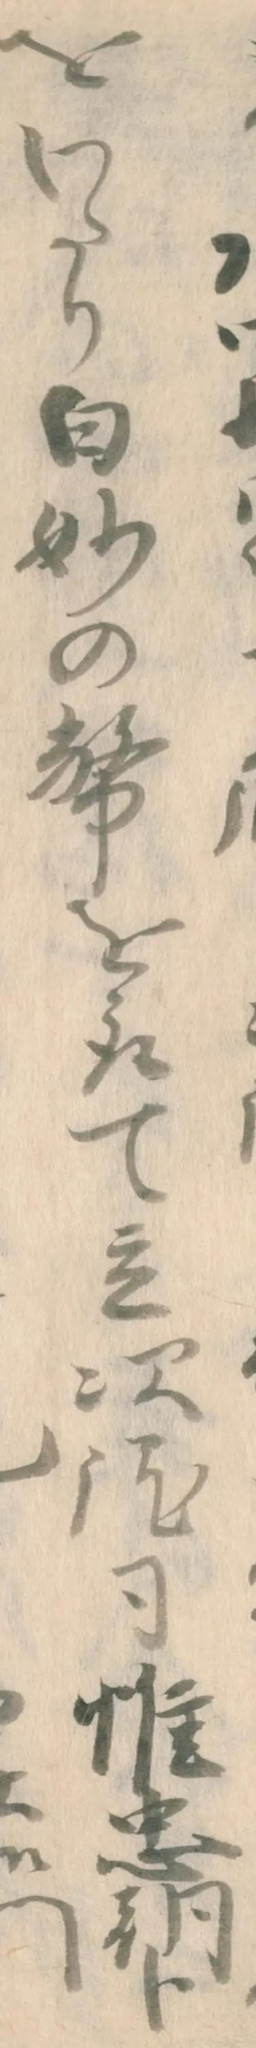をわたり白妙の幣を取て立次院司惟忠朝臣
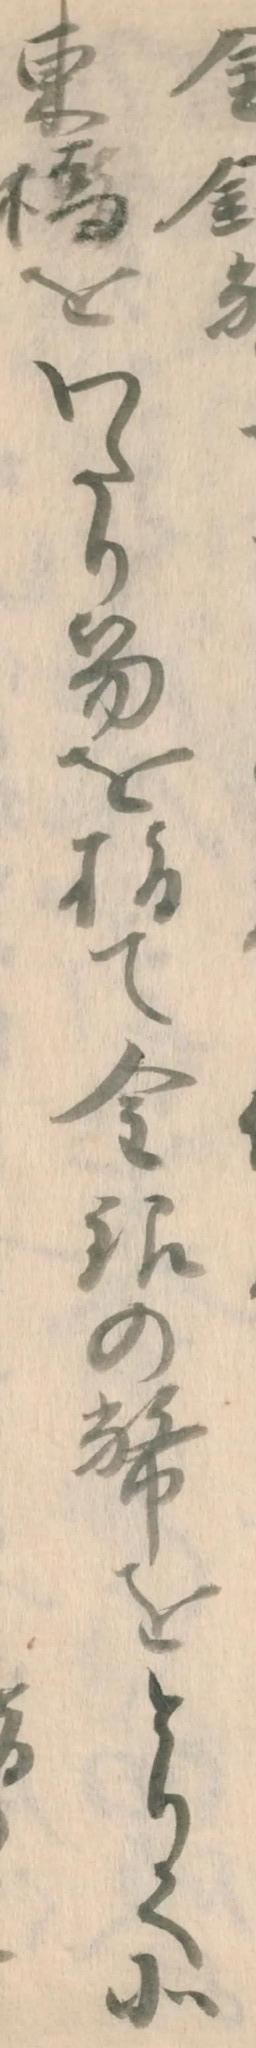東橋をわたり笏を指て金銀の幣をとりて北
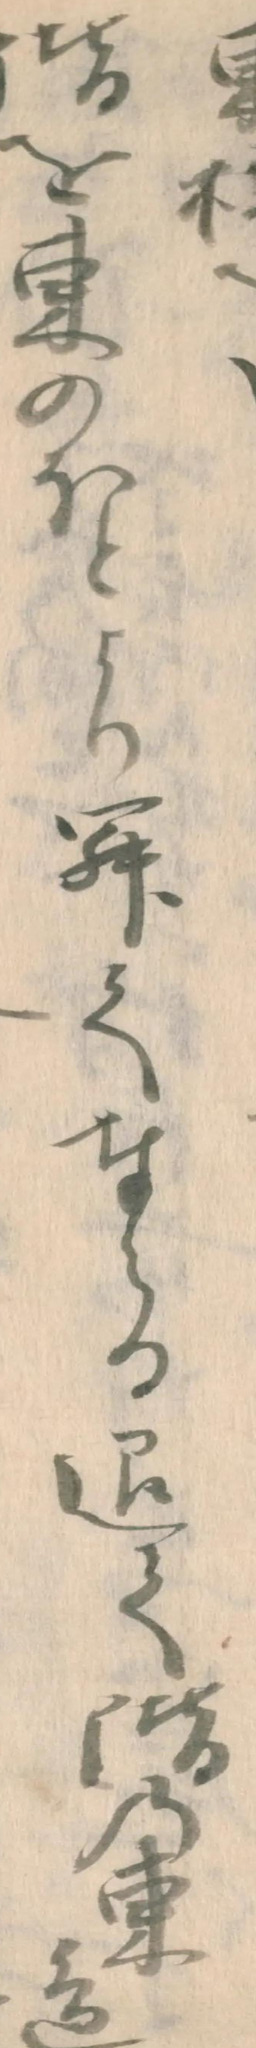階を東のほとより昇て奉らる退て階の東辺
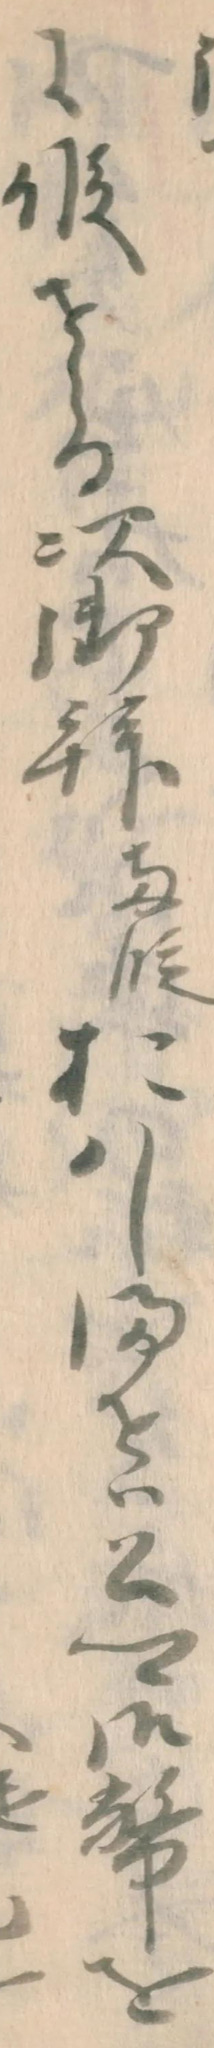に候せらる次御拝両段おはしませは公卿御幣を
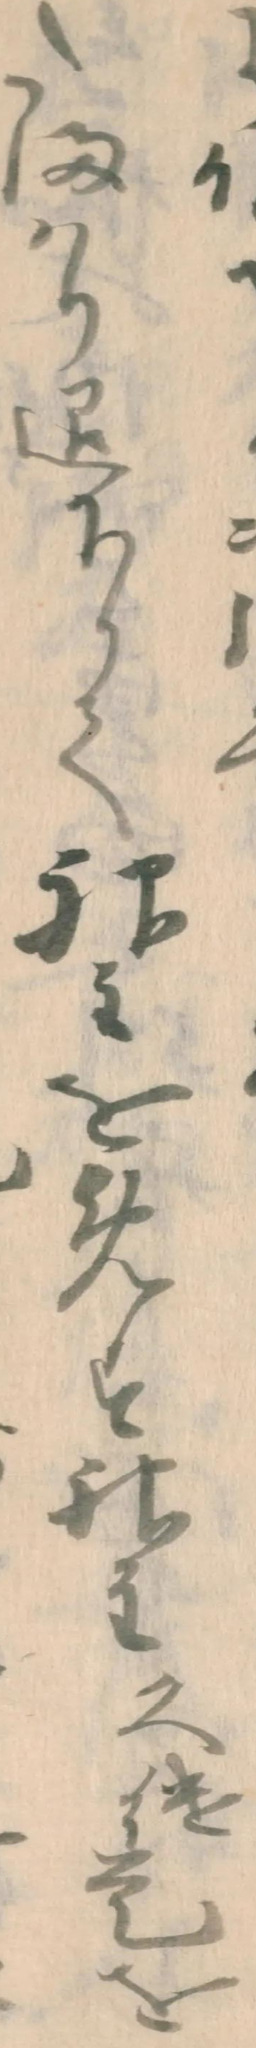たまはり退下りて神主をめす神主久継是を
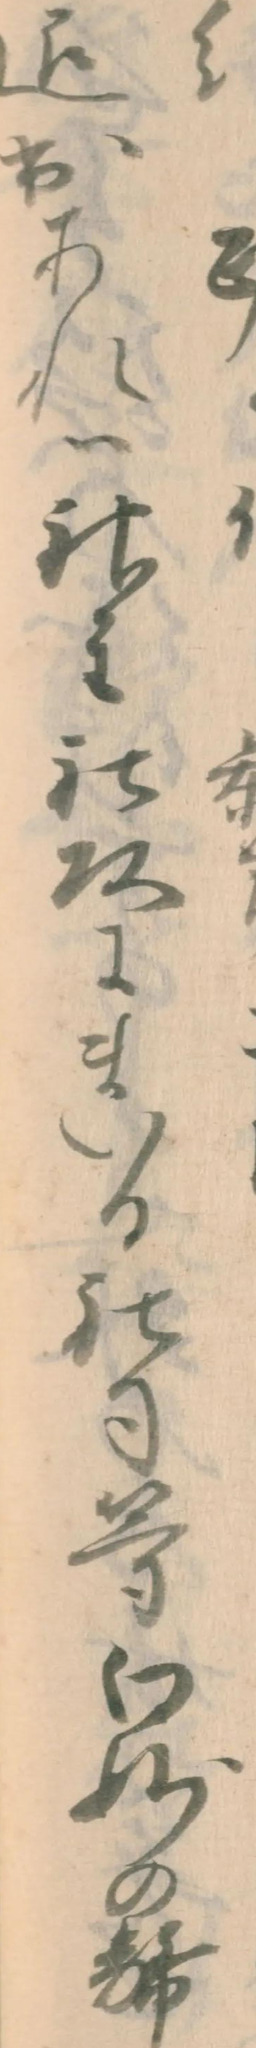退出あれは神主社頭にまいる社司等白妙の幣
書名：賀茂社記録. 第1冊
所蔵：国立国会図書館 National Diet Library, JAPAN
